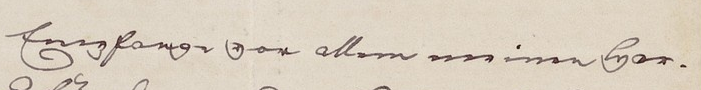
Empfange vor allem meinen war-
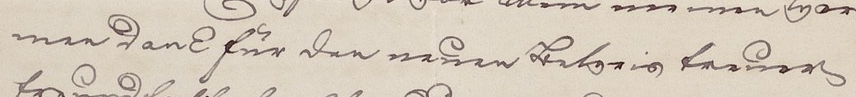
men Dank für den neuen Beweis treuer
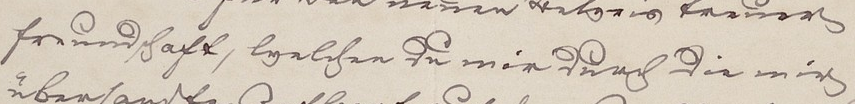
Freundschaft, welchen Du mir durch die mir
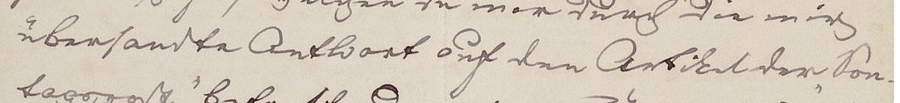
übersandte Antwort auf den Artikel der «Son-
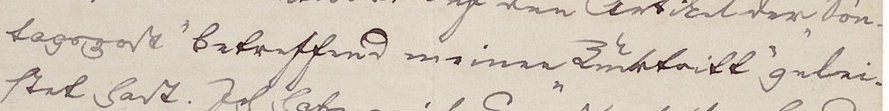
tagspost» betreffend meinen «Rücktritt» gelei-
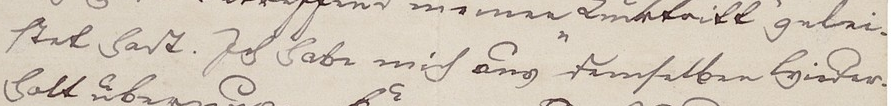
stet hast. Ich habe mich aus demselben wieder-
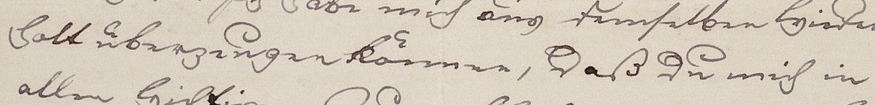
holt überzeugen können, daß Du mich in
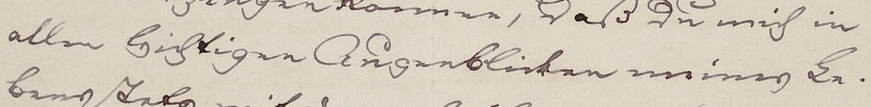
allen wichtigen Augenblicken meines Le-
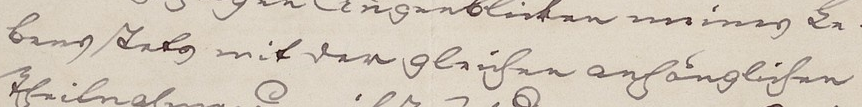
bens stets mit der gleichen anhänglichen
